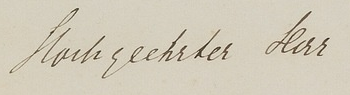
Hochgeehrter Herr
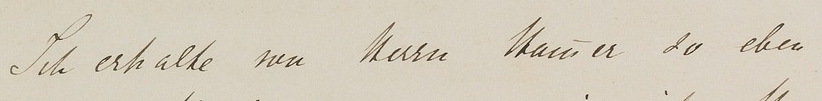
Ich erhalte von Herrn Hammer so eben
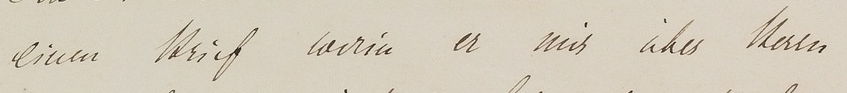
einen Brief worin er mir über Herrn
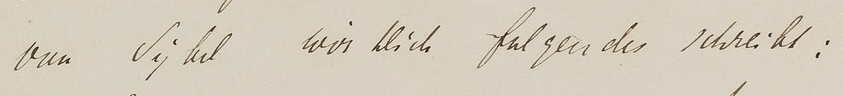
von Sybel wörtlich folgendes schreibt:
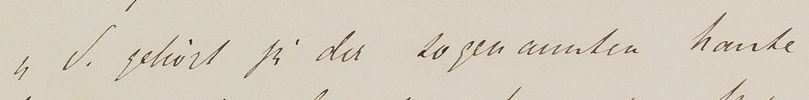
«S. gehört zu der sogenannten haute
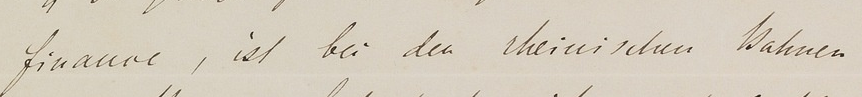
finance, ist bei den rheinischen Bahnen
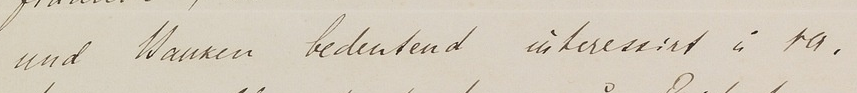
und Banken bedeutend interessirt u ver-
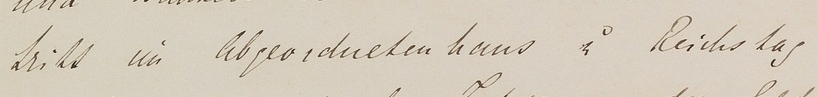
tritt im Abgeordnetenhaus u Reichstag
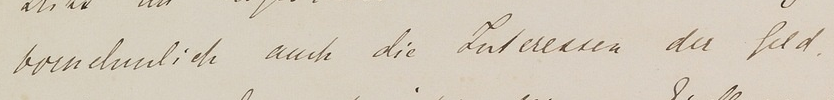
vornehmlich auch die Interessen der Geld-
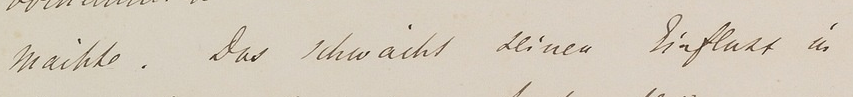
mächte. Das schwächt seinen Einfluss in
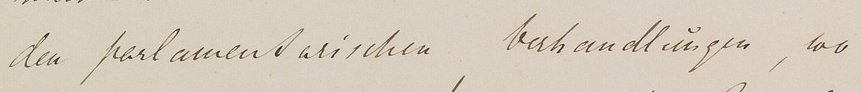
den parlamentarischen Verhandlungen, wo
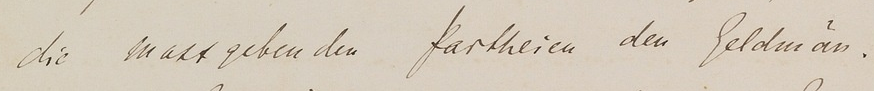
die massgebenden Partheien den Geldmän-
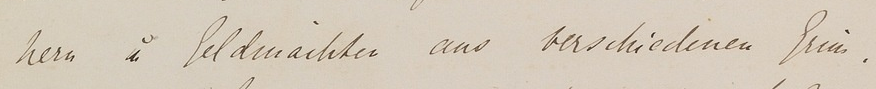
nern u Geldmächten aus verschiedenen Grün-
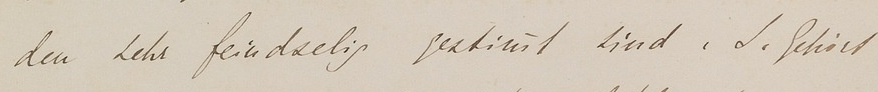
den sehr feindselig gestimmt sind. S. gehört
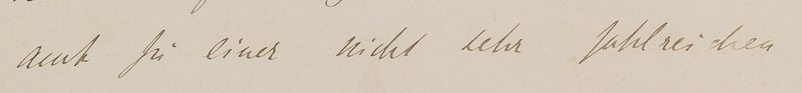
auch zu einer nicht sehr zahlreichen
